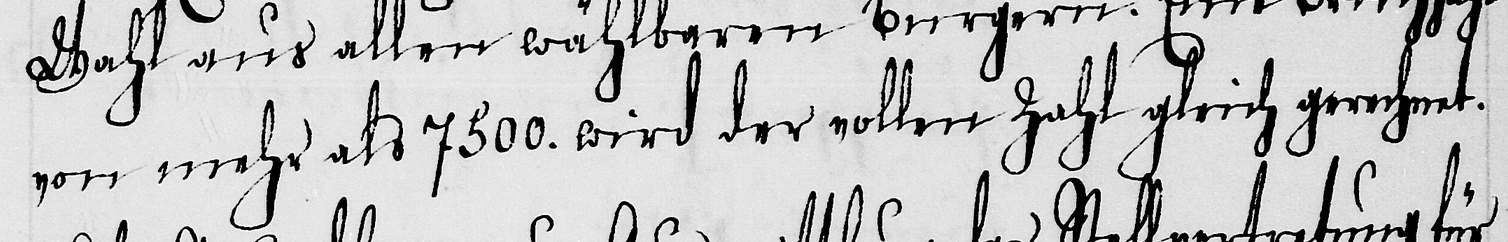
von mehr al 7500. wird der vollen Zahl gleich gerechnet.
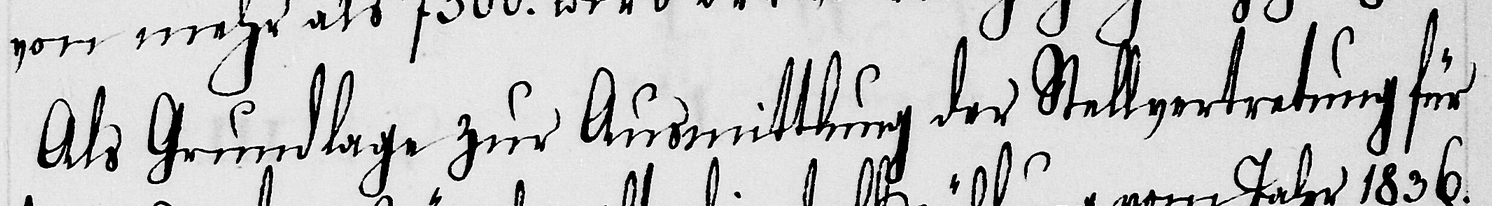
Als Grundlage zur Ausmittlung der Stellvertretung für
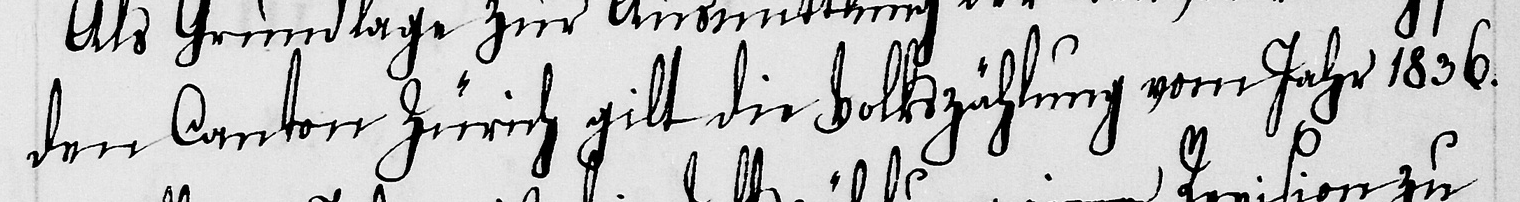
den Canton Zürich gilt die Volkszählung vom Jahr 1836.
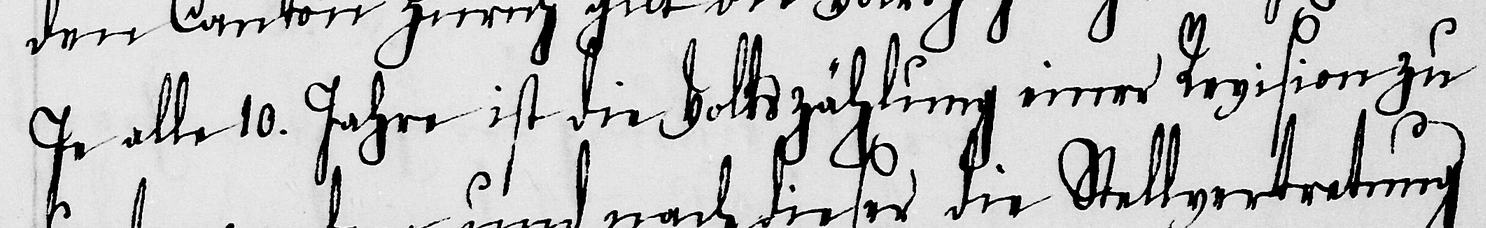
Je alle 10. Jahre ist die Volkszählung einer Revision zu
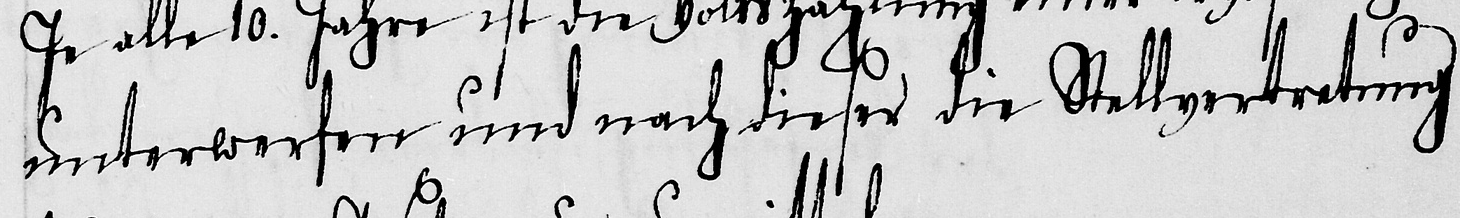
unterwerfen und nach dieser die Stellvertretung
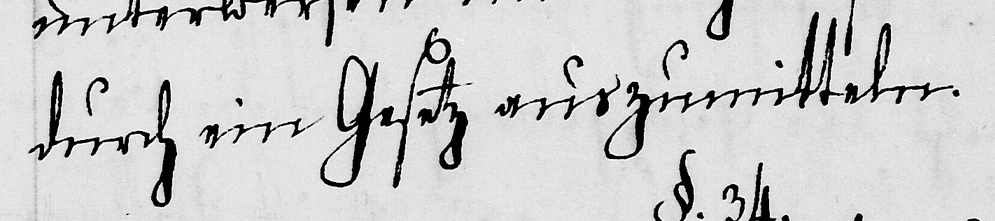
durch ein Gesetz auszumitteln.
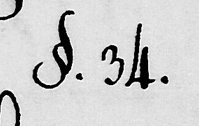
§. 34.
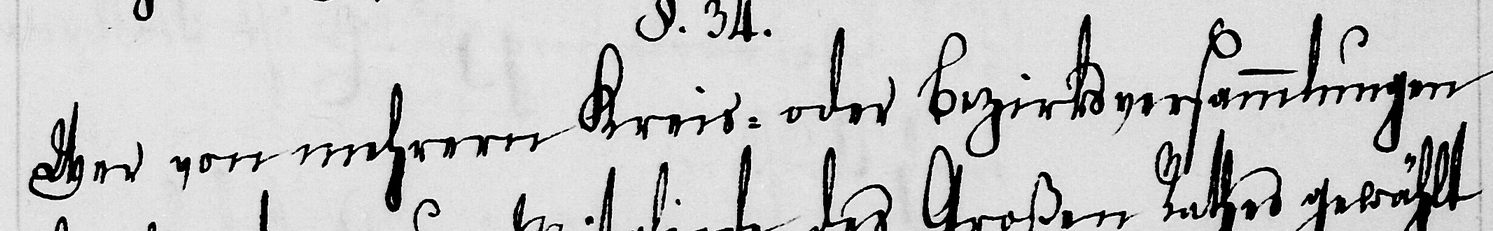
Wer von mehrern Kreis- und Bezirksversammlungen
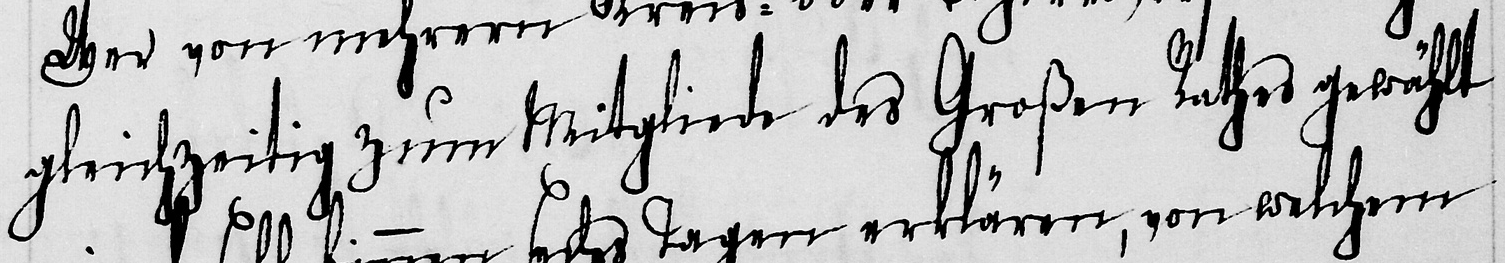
gleichzeitig zum Mitgliede des Großen Rathes gewählt
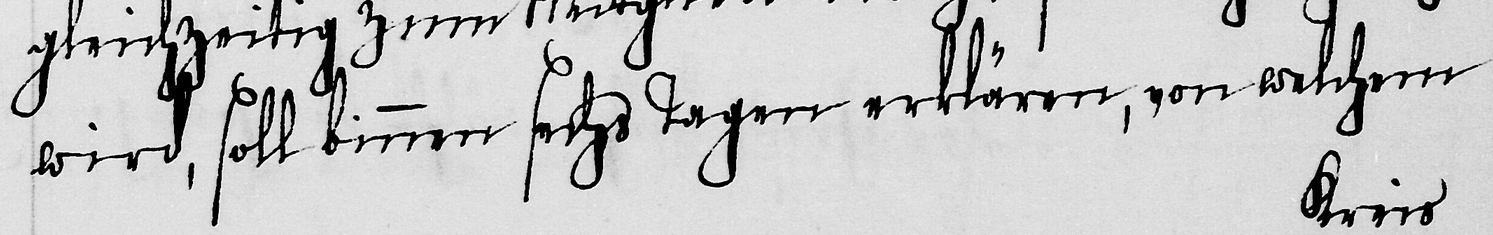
wird, soll binnen sechs Tagen erklären, von welchem
